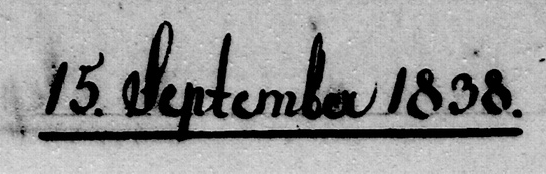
15. September 1838.]
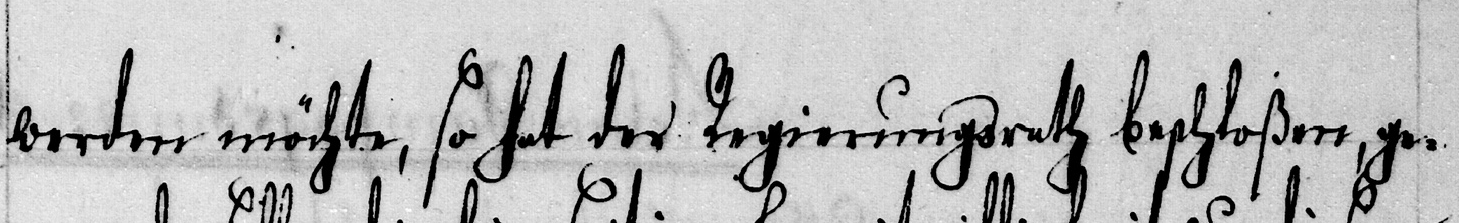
werden möchte, so hat der Regierungsrath beschloßen, ge¬
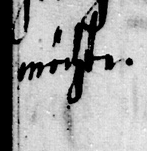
nen in
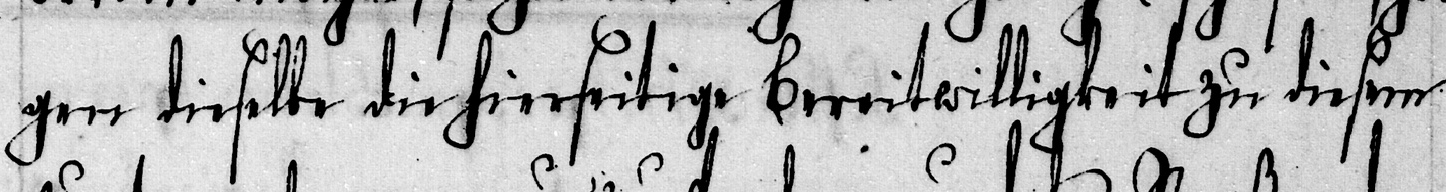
gen dieselbe die hierseitige Bereitwilligkeit zu diesem
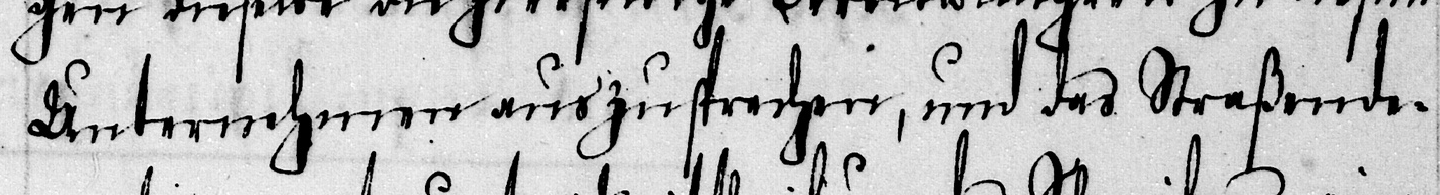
Unternehmen auszusprechen, und das Straßende¬
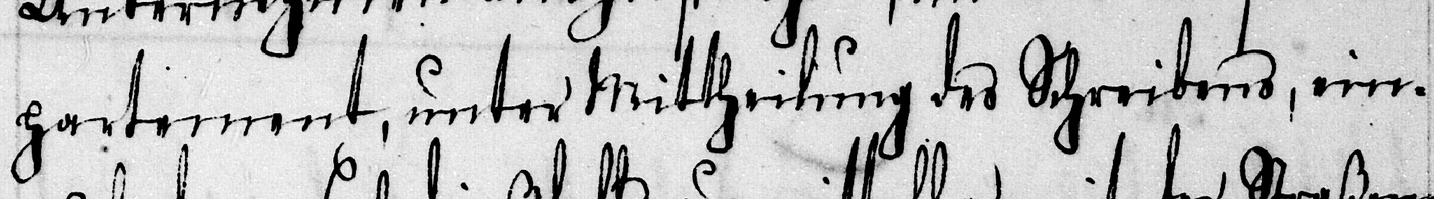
partement, unter Mittheilung des Schreibens, ein¬
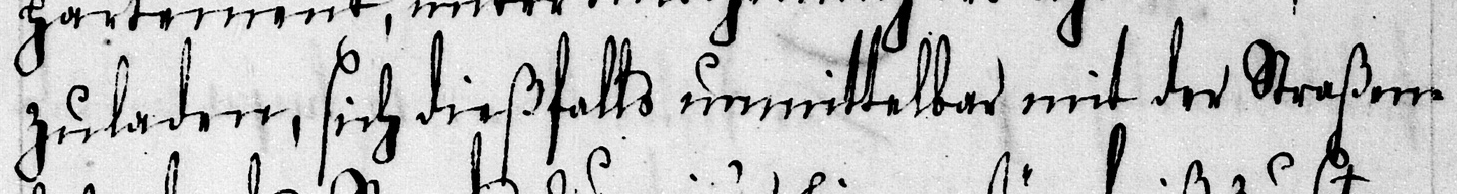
zuladen, sich dießfalls unmittelbar mit der Straßen¬
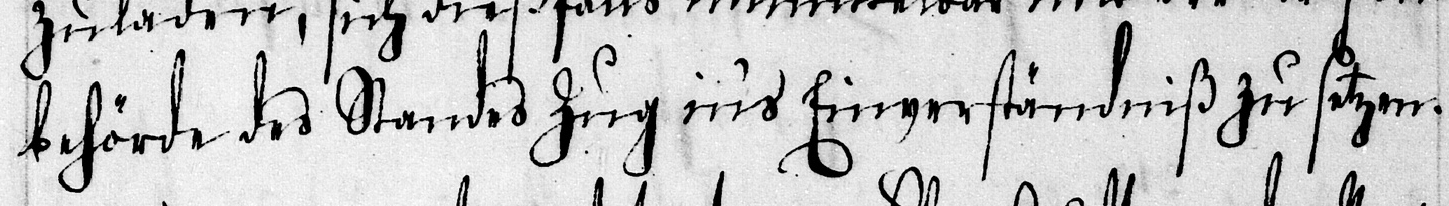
behörde des Standes Zug in’s Einverständniß zu setzen.
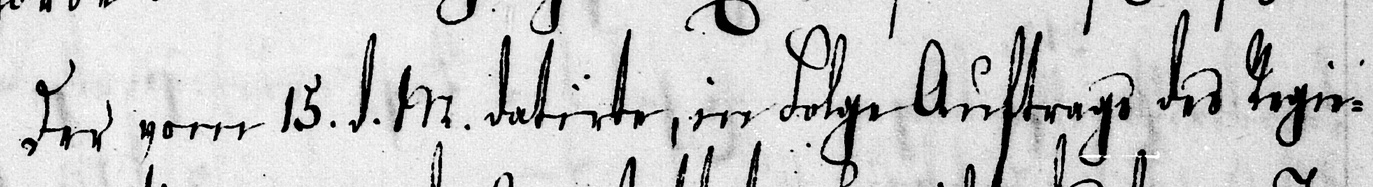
Der vom 15. d. M. datirte, in Folge Auftrags des Regie¬
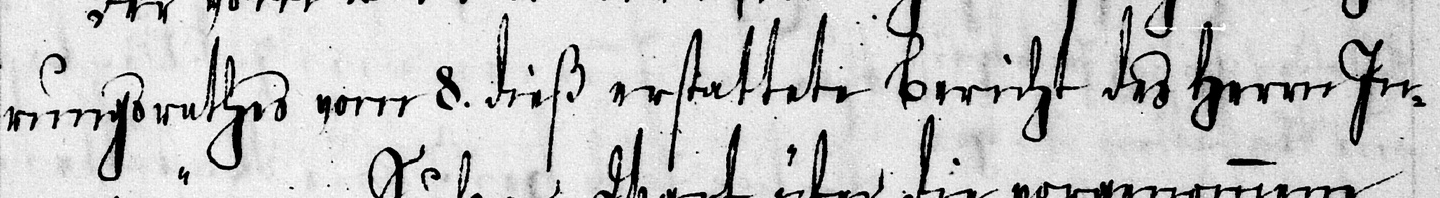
rungsrathes vom 8. dieß erstattete Bericht des Herrn In¬
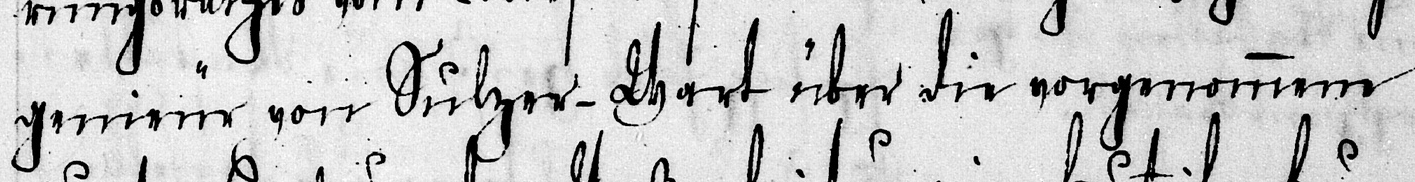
genieur von Sulzer-Wart über die vorgenommene
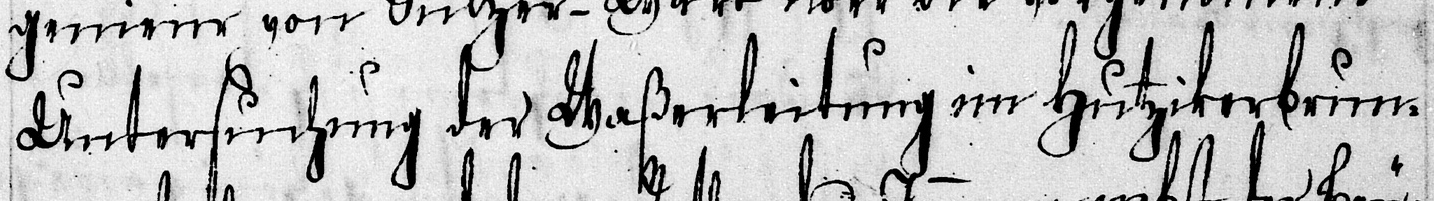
Untersuchung der Waßerleitung im Hutzikerbrun¬
